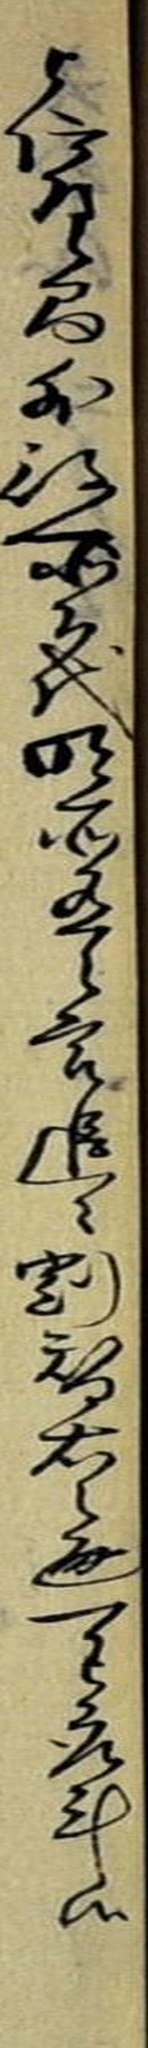被仰付候間外役所下代明所有之節追々割替右之通可被取計候
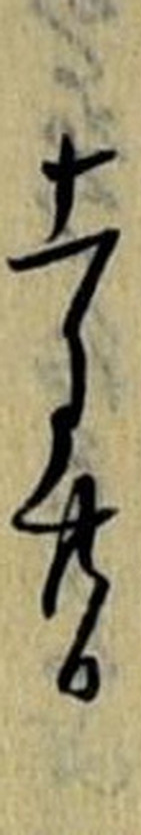十一月廿日
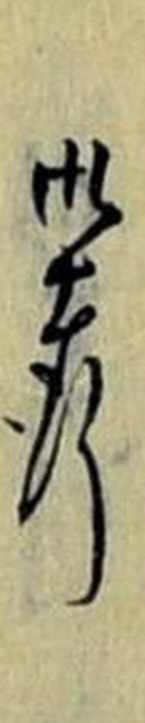御奉行
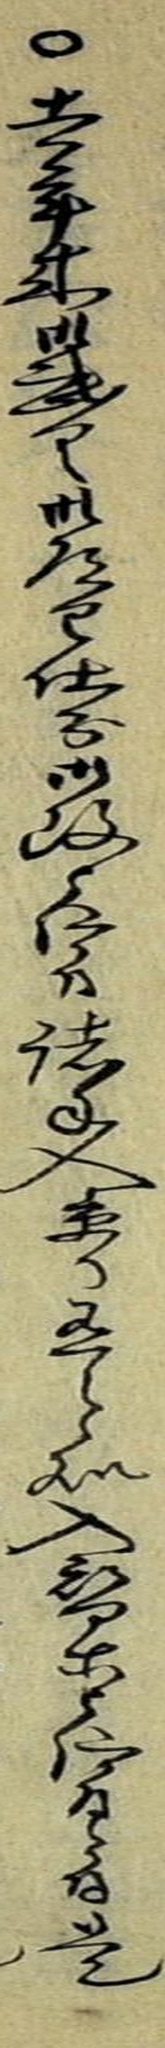〇去年来御武具御道具仕分御改被仰付諸手入交り有之候処入替等被仰付候ニ付是
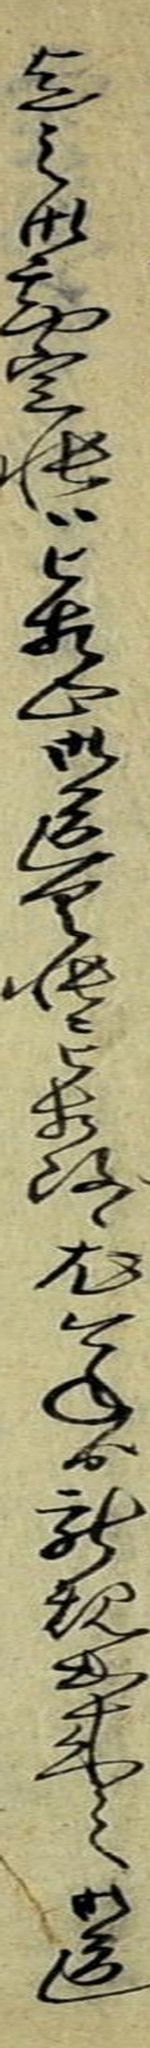迄之御勘定帳ハ被相止御道具帳ニ被相改候尤今年ゟ新規出来之御道
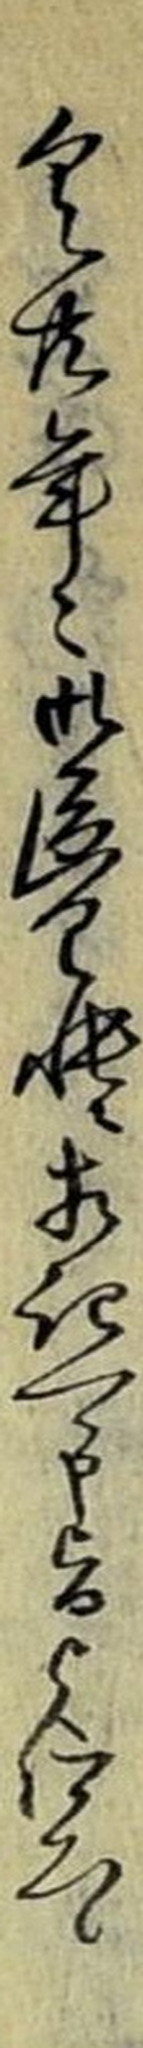具共年々御道具帳ニ相記可申旨被仰出候
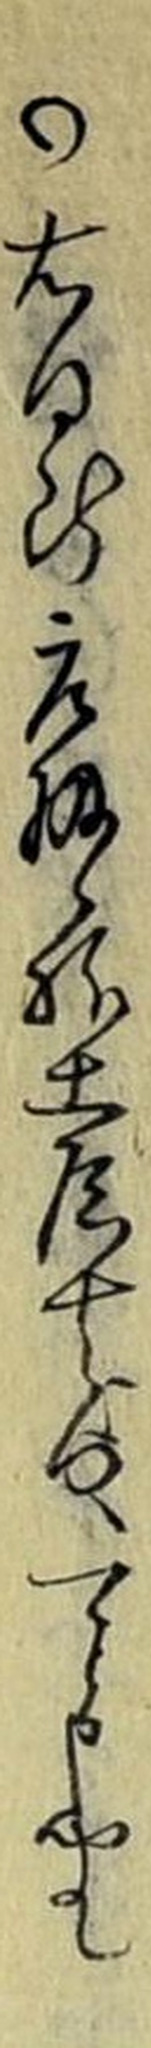〇右同断取扱候様土屋十郎右衛門へ可被申聞候
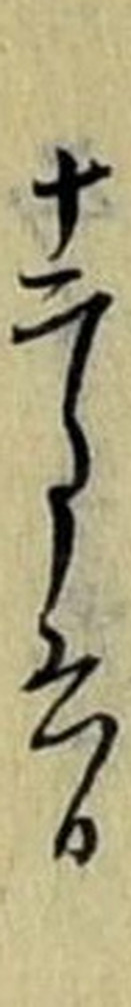十二月六日

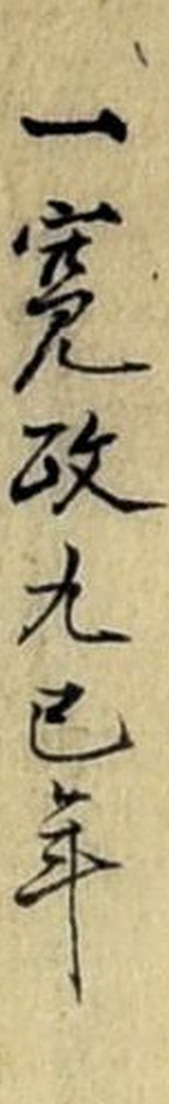一寛政九巳年
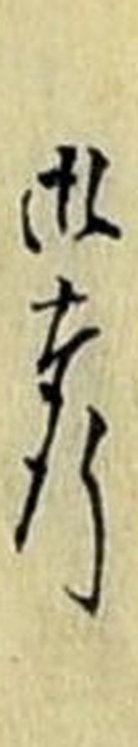御奉行
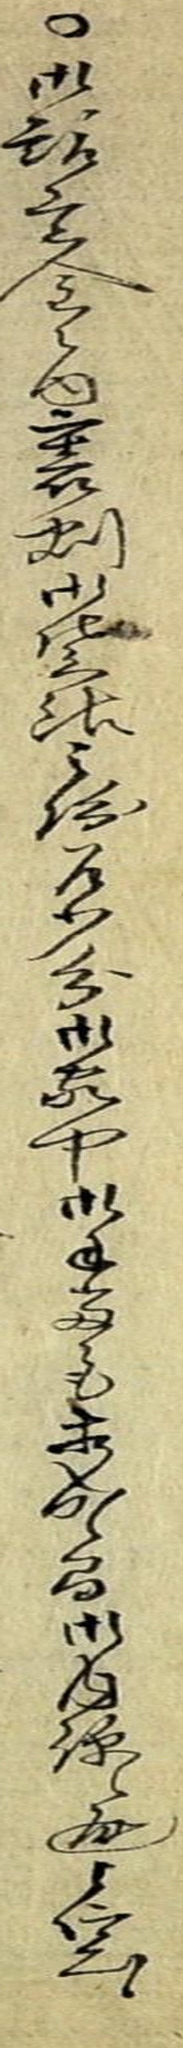〇御趣意金之内裏判御貸銀之儀乍少分御家中御手当ニも相成候間御内許之通被仰出候
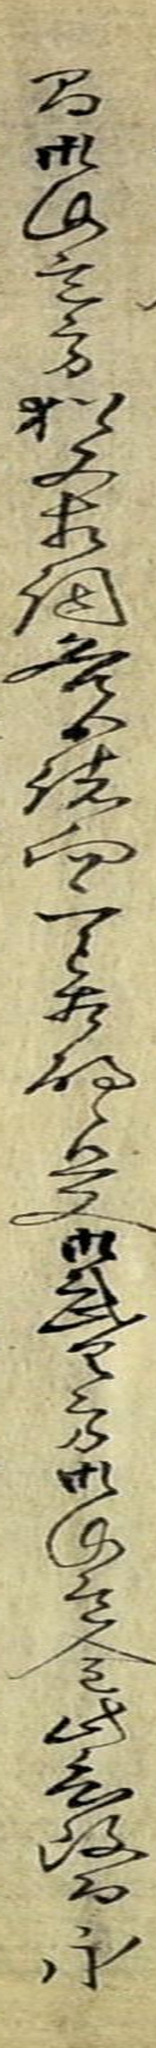間御趣意方猶又相調各ゟ諸向へ可被相触候且又御武具方御趣意金此度改而永
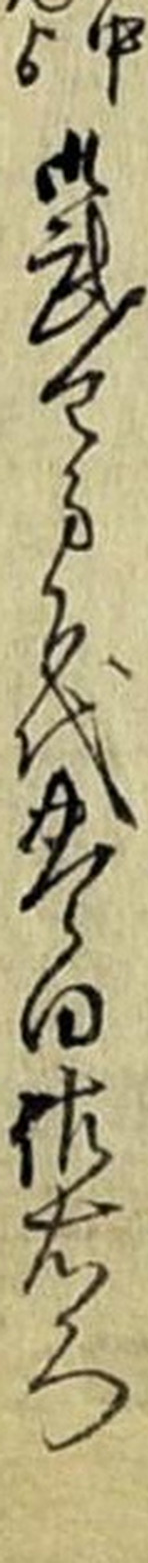老ゟ御武具方下代豊田佐右衛門
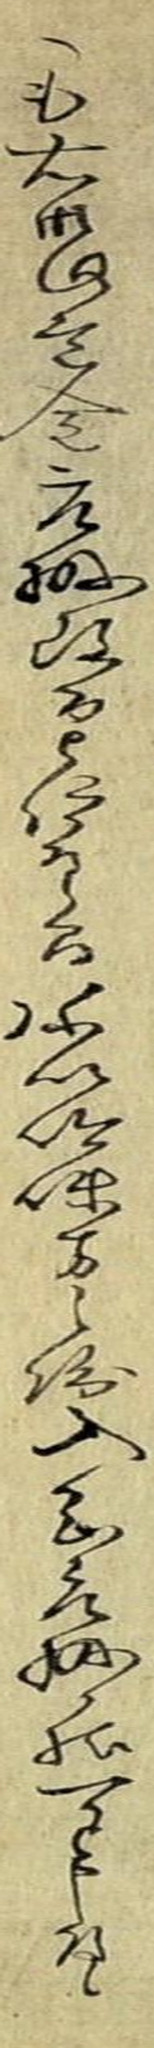へも右御趣意金取扱改而被仰付候間弥以吟味方之儀入念取扱候様可被申付候
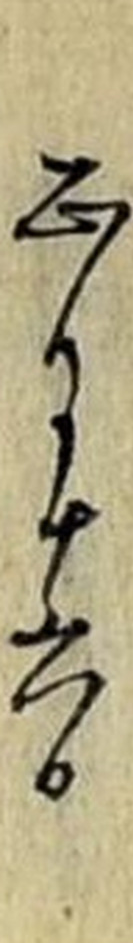正月十六日
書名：命令之部 三
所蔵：福井県文書館 Fukui Prefectural Archives
